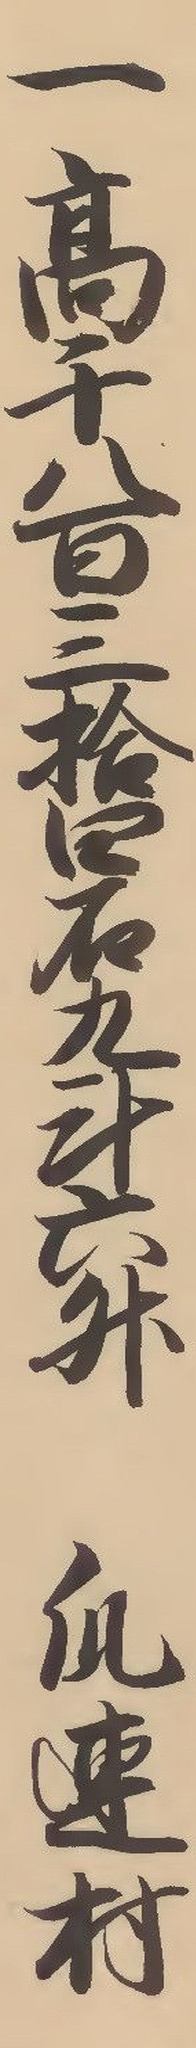一高千八百三拾四石九斗六升瓜連村
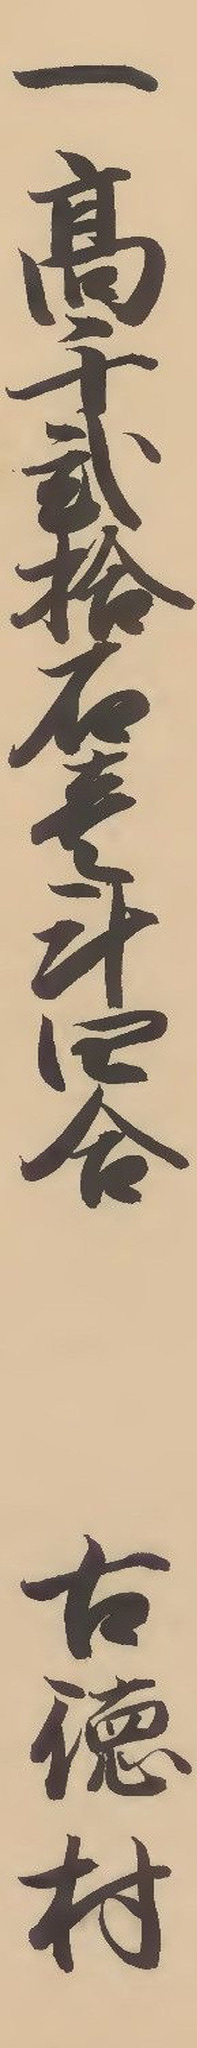一高千弐拾石壱斗四合古徳村

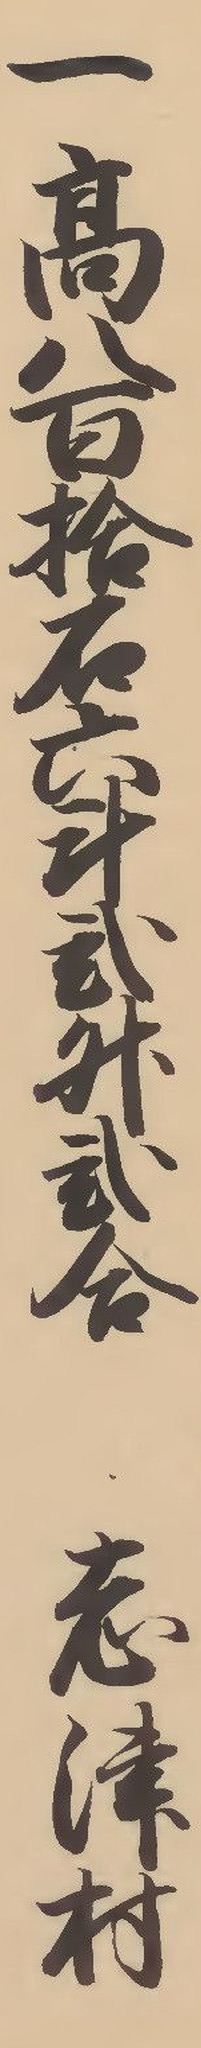一高八百拾石六斗弐升弐合志津村
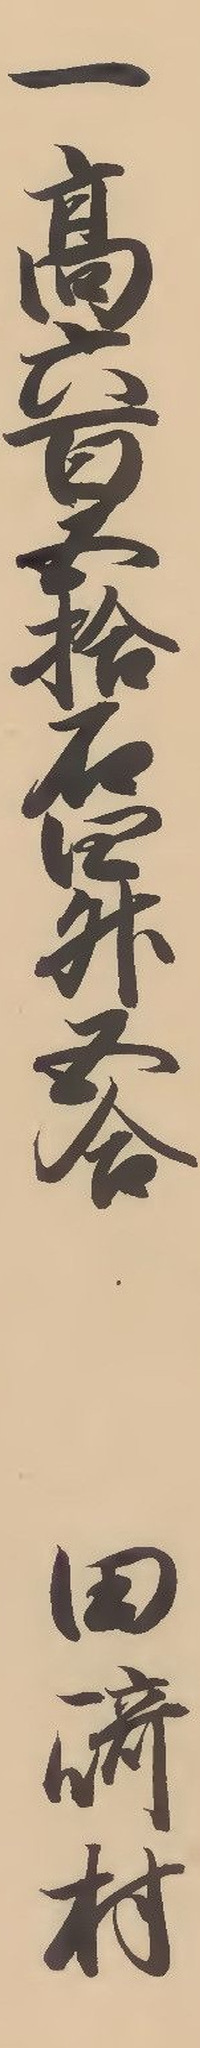一高六百五拾石四升五合田崎村
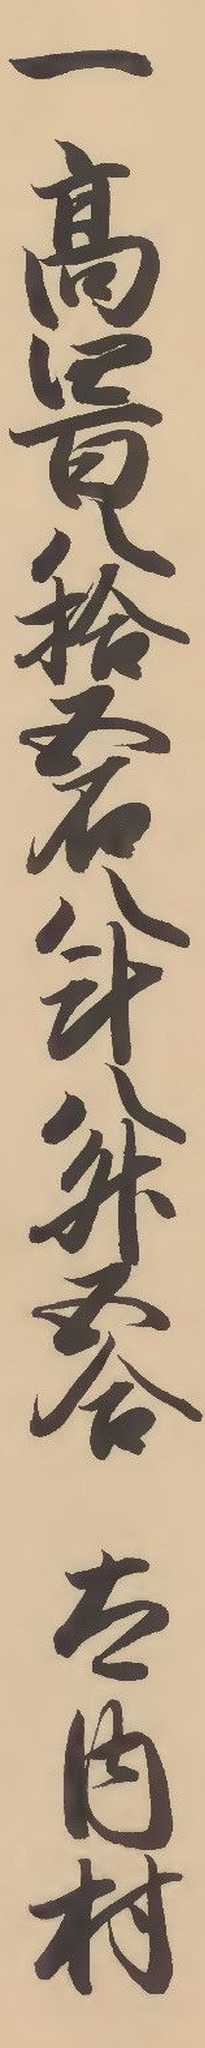一高四百八拾五石八斗八升五合太内村
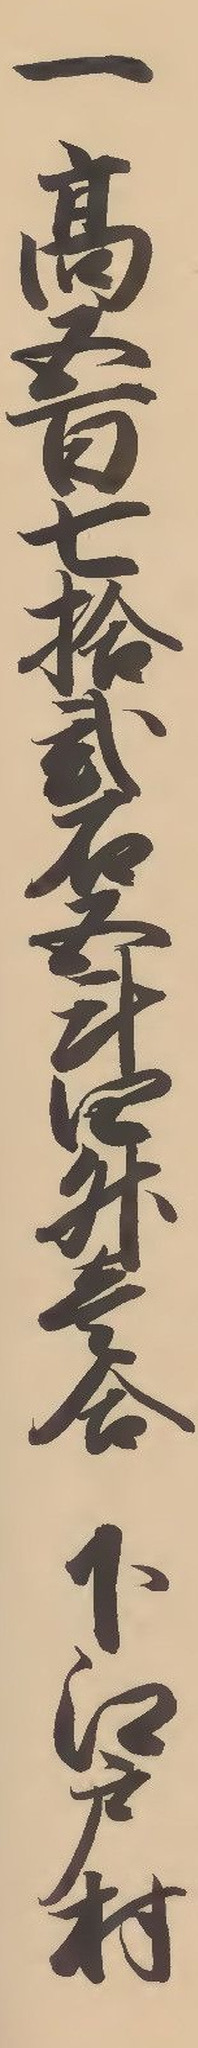一高五百七拾弐石五斗四升壱合下江戸村
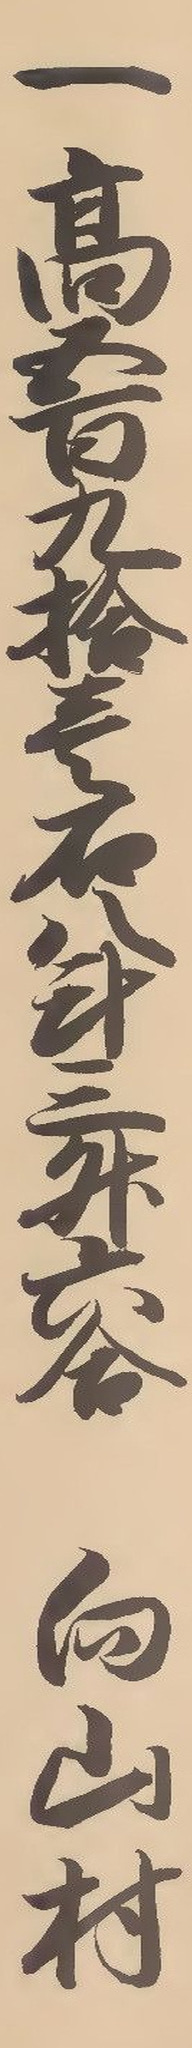一高五百九拾壱石八斗三升六合向山村
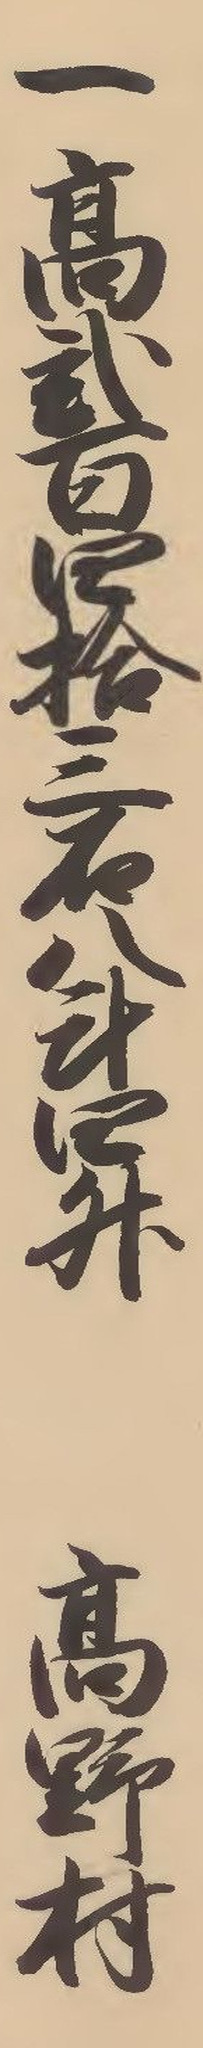一高弐百四拾三石八斗四升高野村
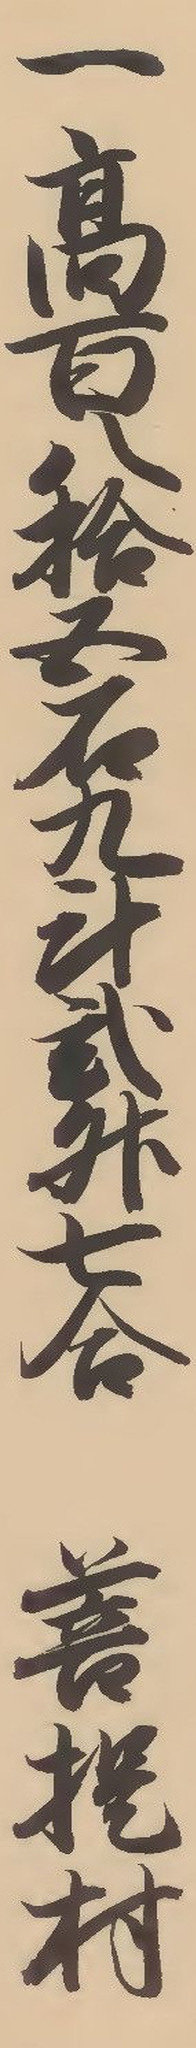一高百八拾五石九斗弐升七合菩提村
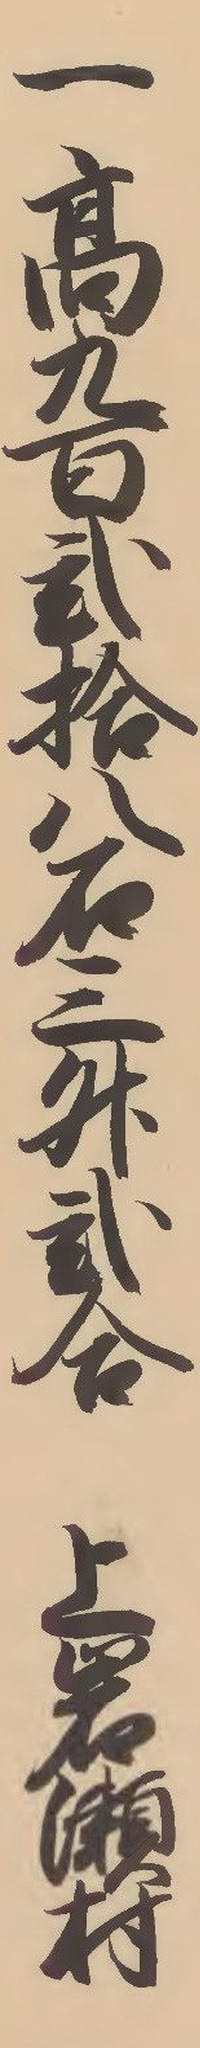一高九百弐拾八石三升弐合上岩瀬村

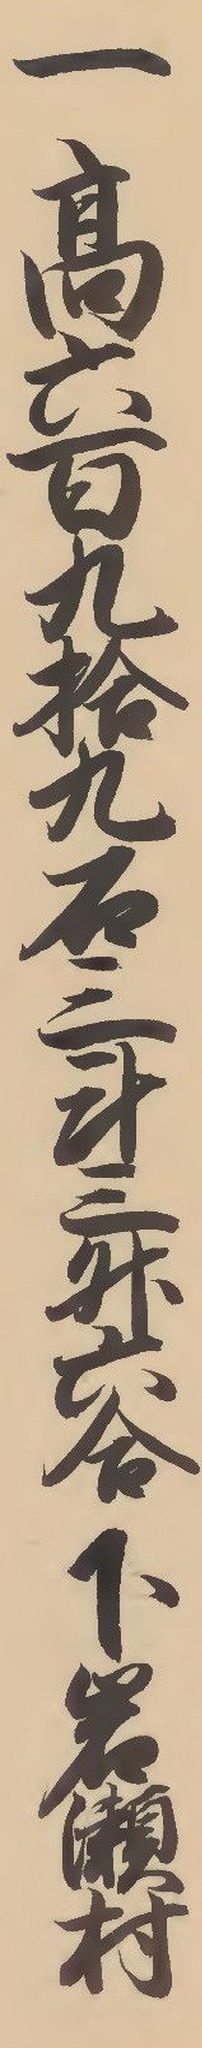一高六百九拾九石三斗三升六合下岩瀬村
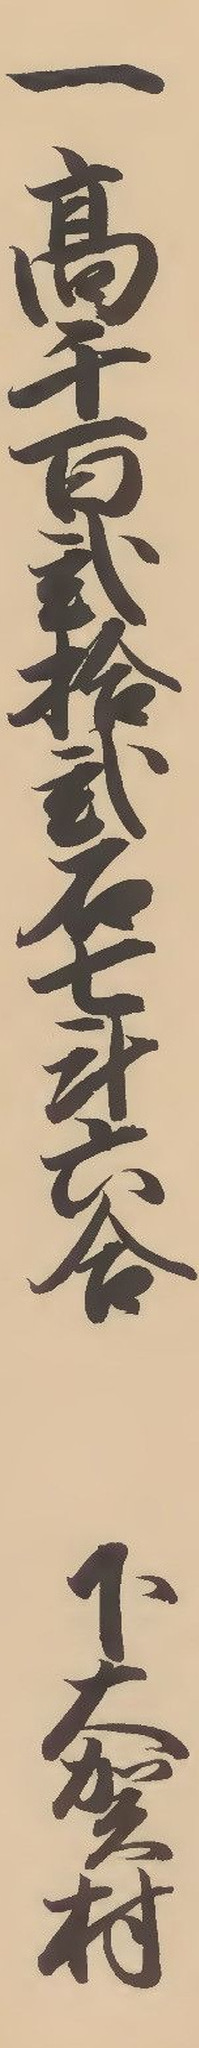一高千百弐拾弐石七斗六合下大賀村
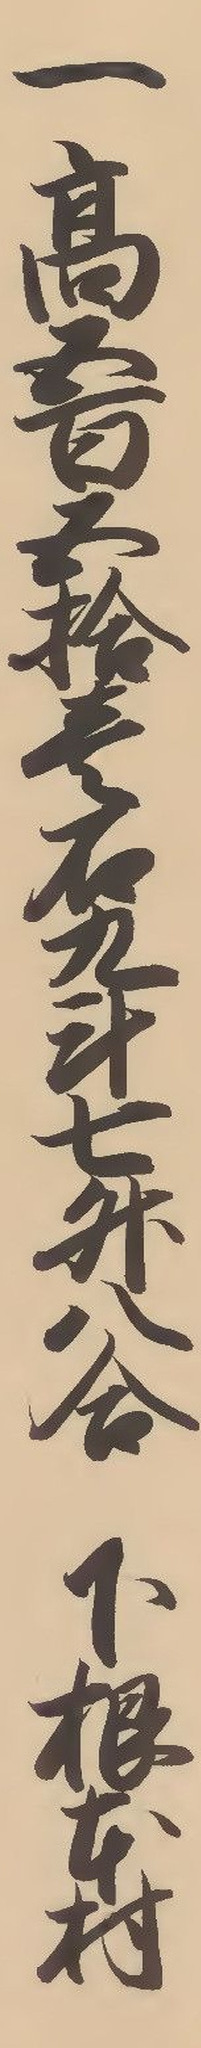一高五百五拾壱石九斗七升八合下根本村
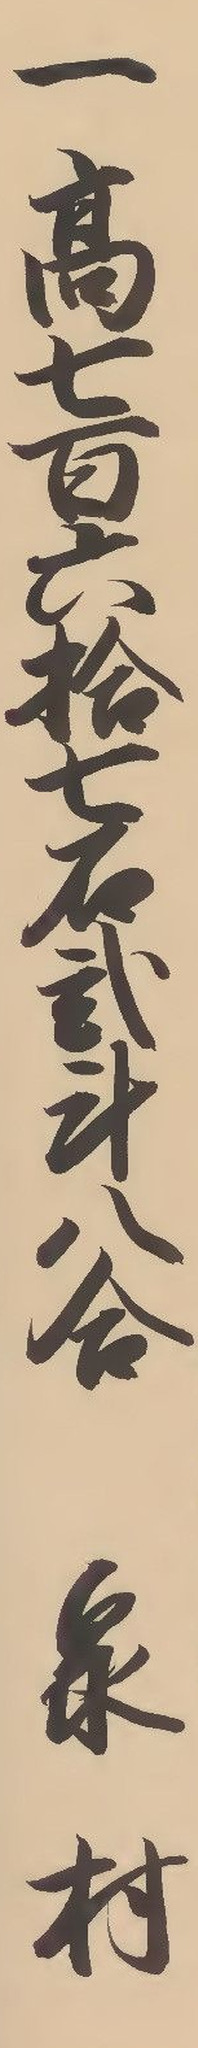一高七百六拾七石弐斗八合泉村
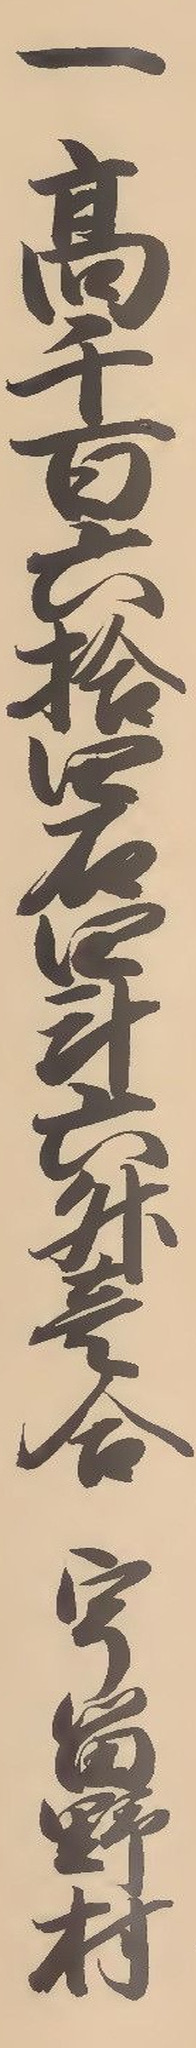一高千百六拾四石四斗六升壱合宇留野村
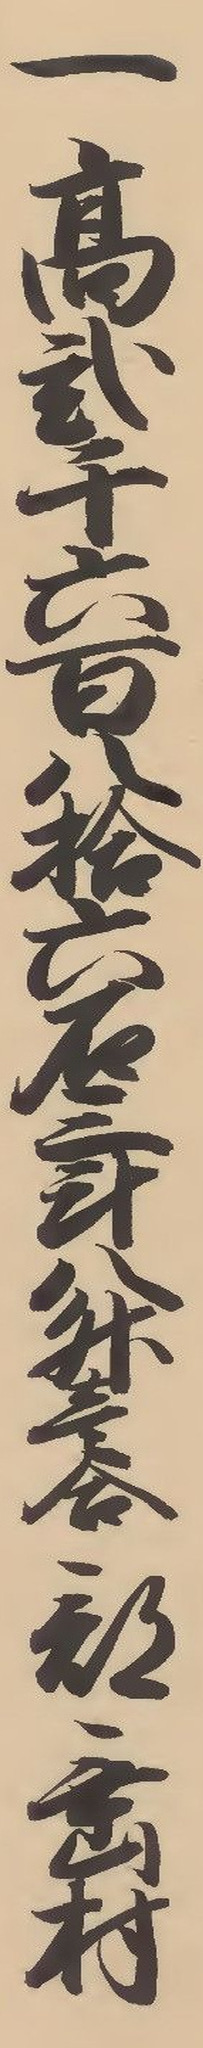一高弐千六百八拾六石三斗八升壱合部垂村
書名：常陸国郷帳
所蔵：国立公文書館 National Archives of Japan
